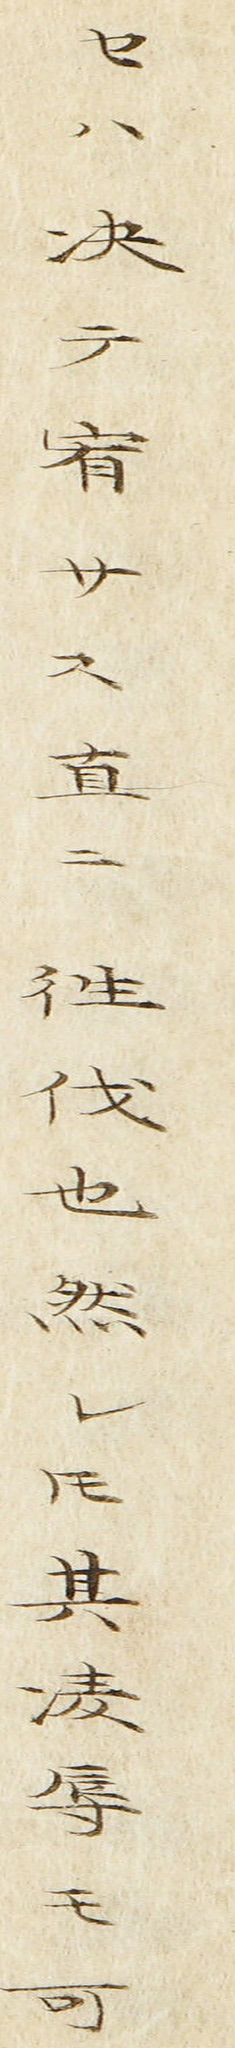セハ決テ宥サス直ニ往伐也然レトモ其凌辱モ可
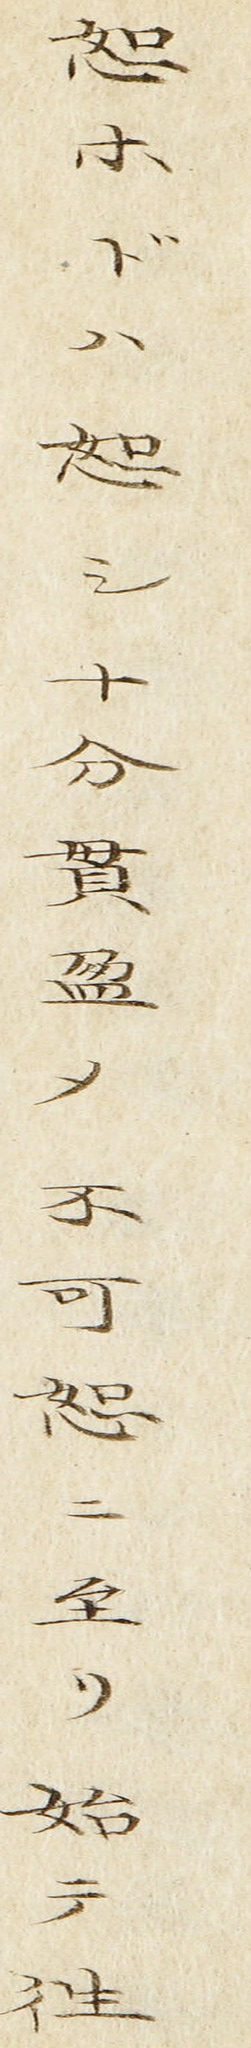恕ホドハ恕シ十分貫盈シテ不可恕ニ至リ始テ往
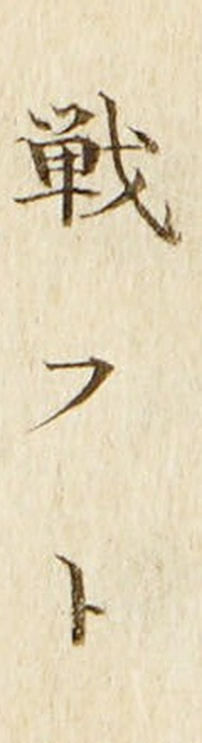戦フト
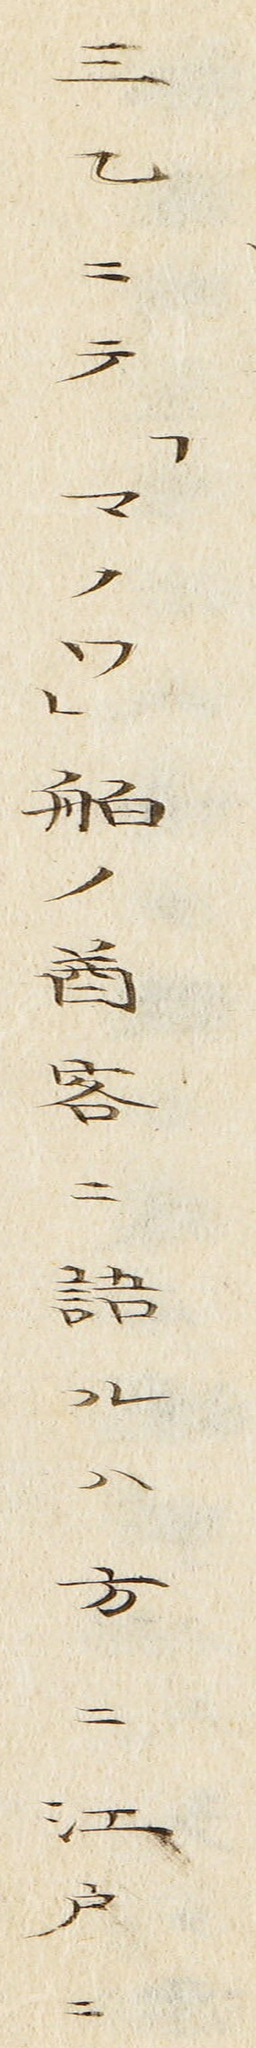〇三乙ニテ「マノワ」舶ノ酋客ニ語ルハ方ニ江戸ニ
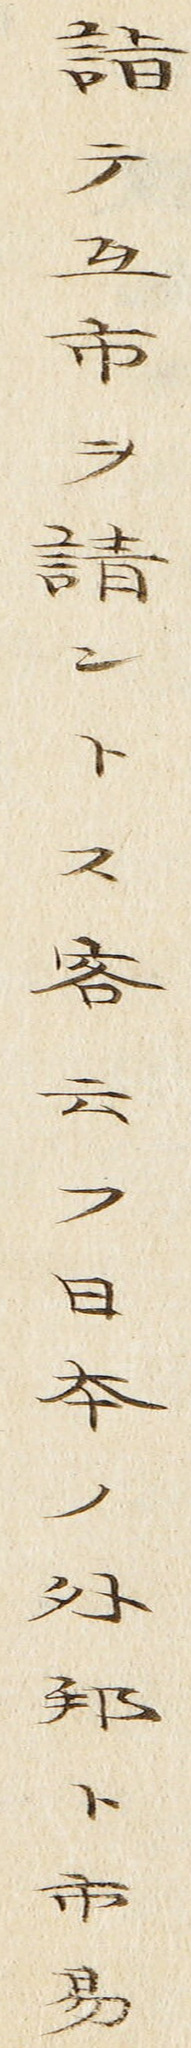詣テ互市ヲ請ントス客云フ日本ノ外邦ト市易
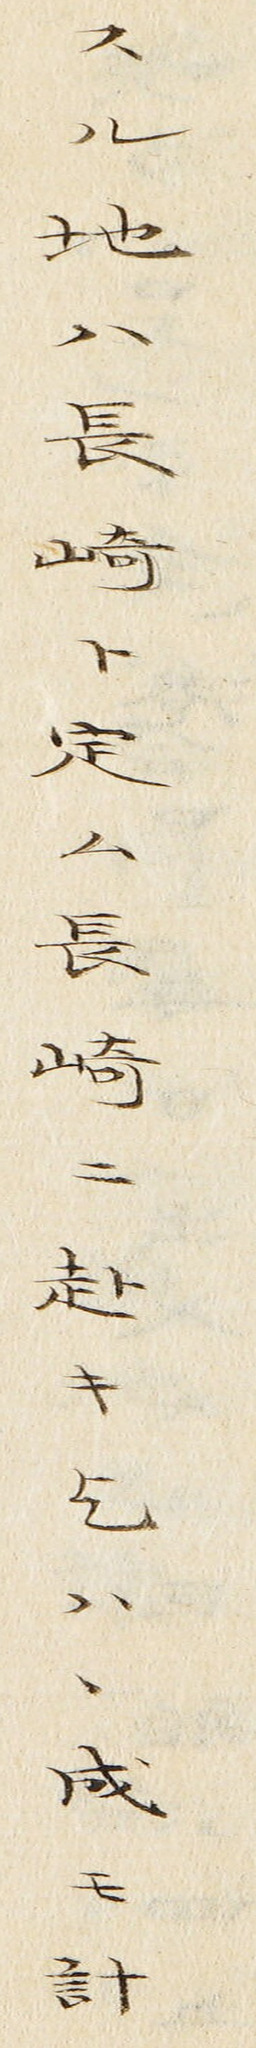スル地ハ長崎ト定ム長崎ニ赴キ乞ハゝ成モ計
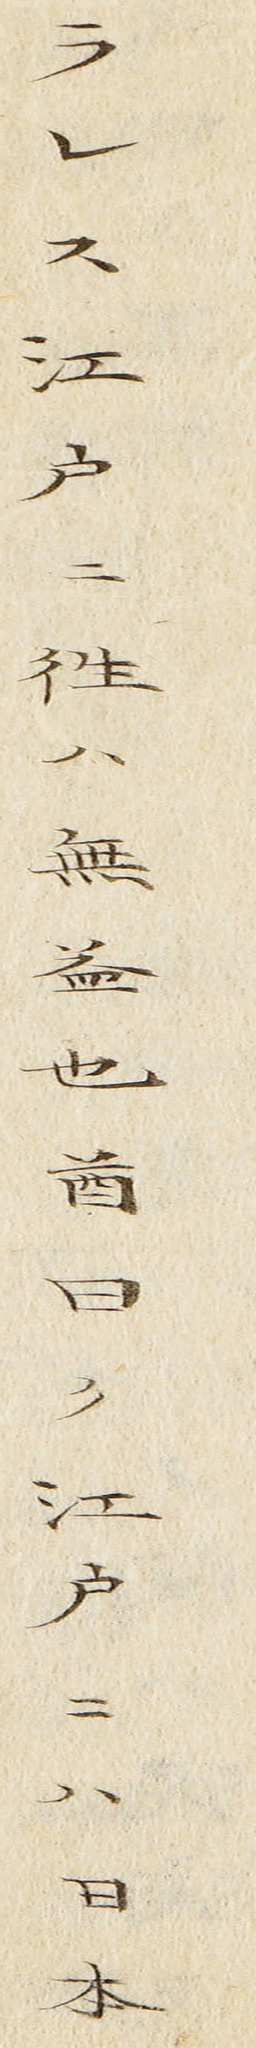ラレス江戸ニ往ハ無益也酋曰ク江戸ニハ日本
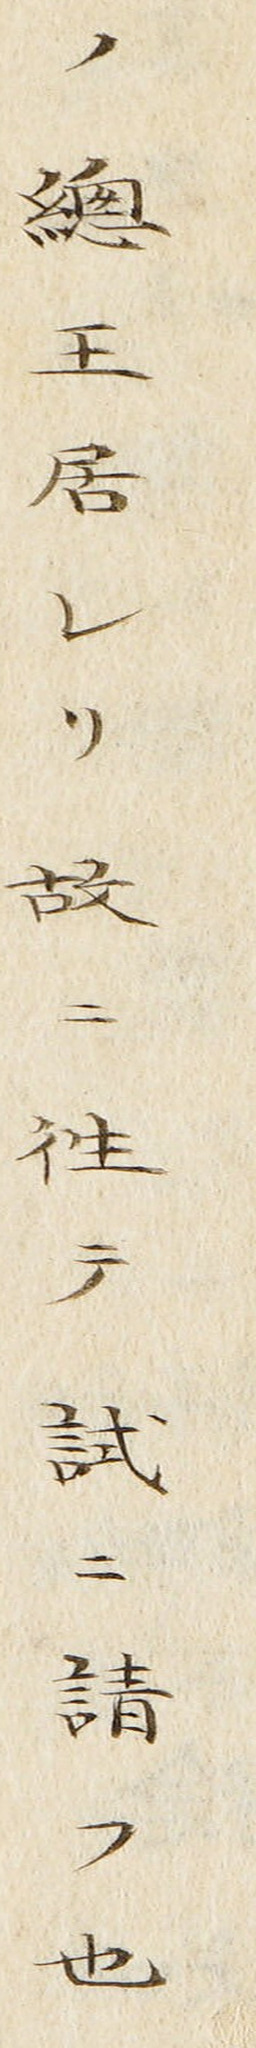ノ總王居レリ故ニ往テ試ニ請フ也
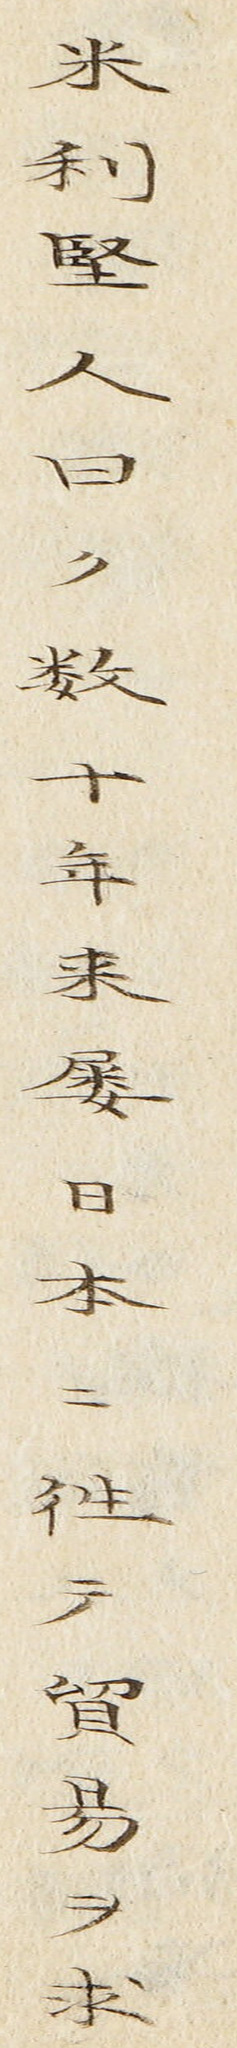〇米利堅人曰ク数十年来屡日本ニ往テ貿易ヲ求
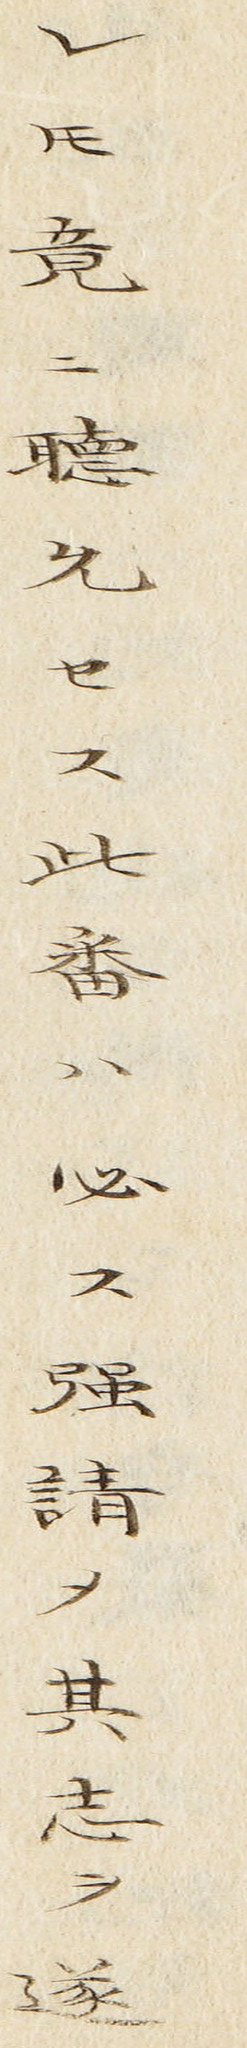レトモ竟ニ聴セス此番ハ強請シテ其志ヲ遂
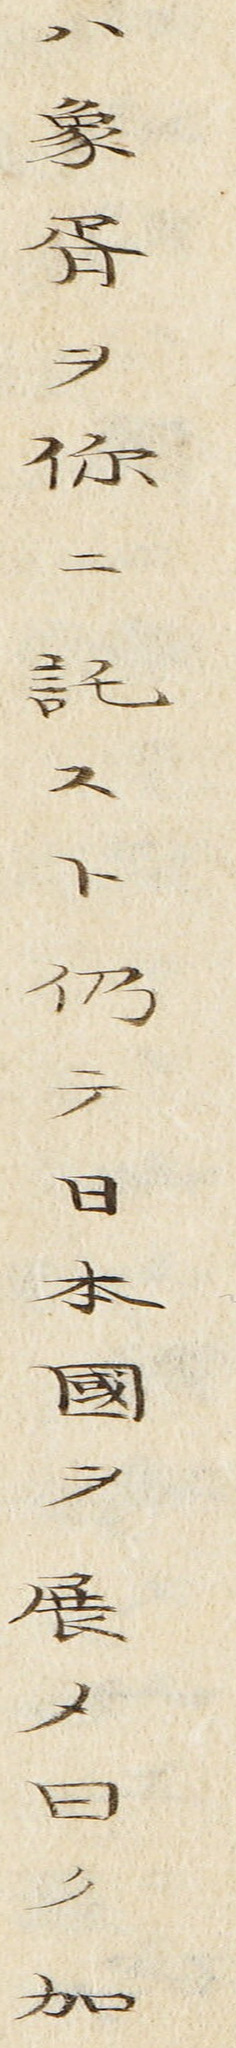ハ象胥ヲ你ニ託スト仍テ日本國ヲ展シテ曰ク加
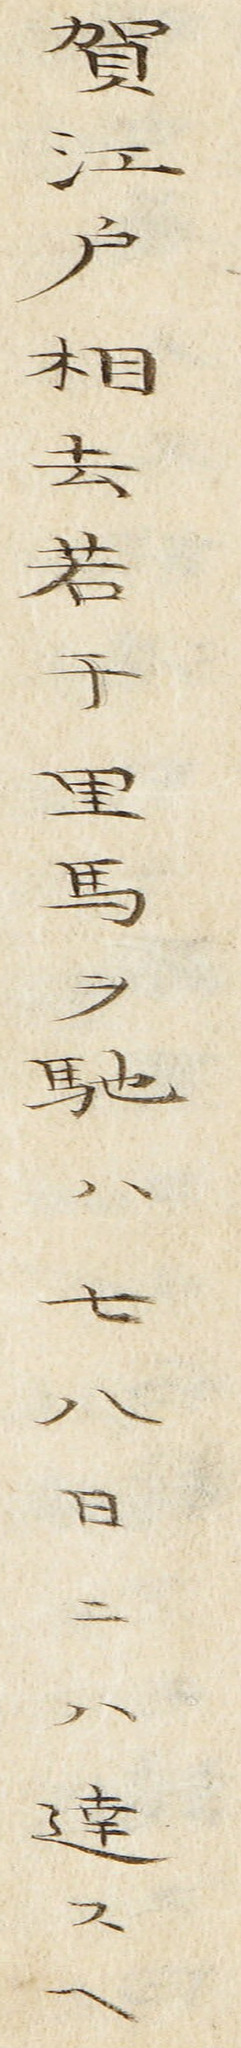賀江戸相去若干里馬ヲ馳ハ七八日ニハ達スヘ
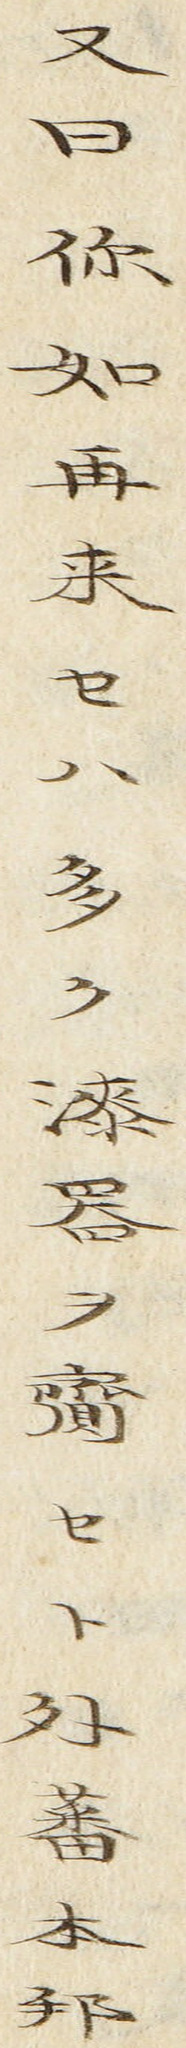〇又曰你如再来セハ多ク漆器ヲ齎セト外蕃本邦
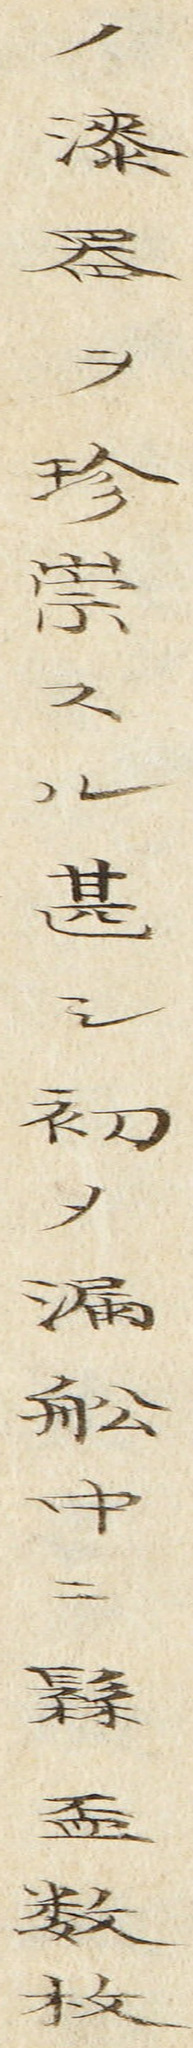ノ漆器ヲ珍崇スル甚シ初メ漏舩中ニ盃数枚

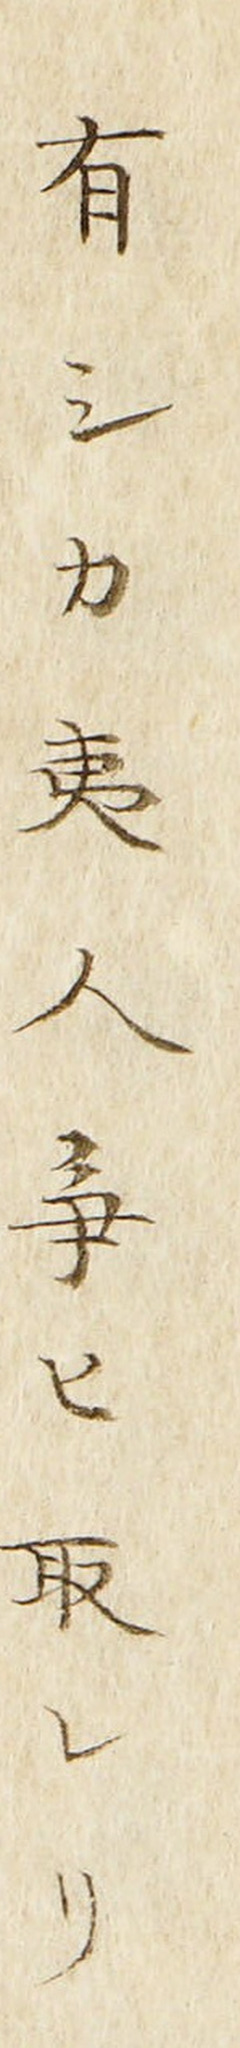有シカ夷人争ヒ取レリ
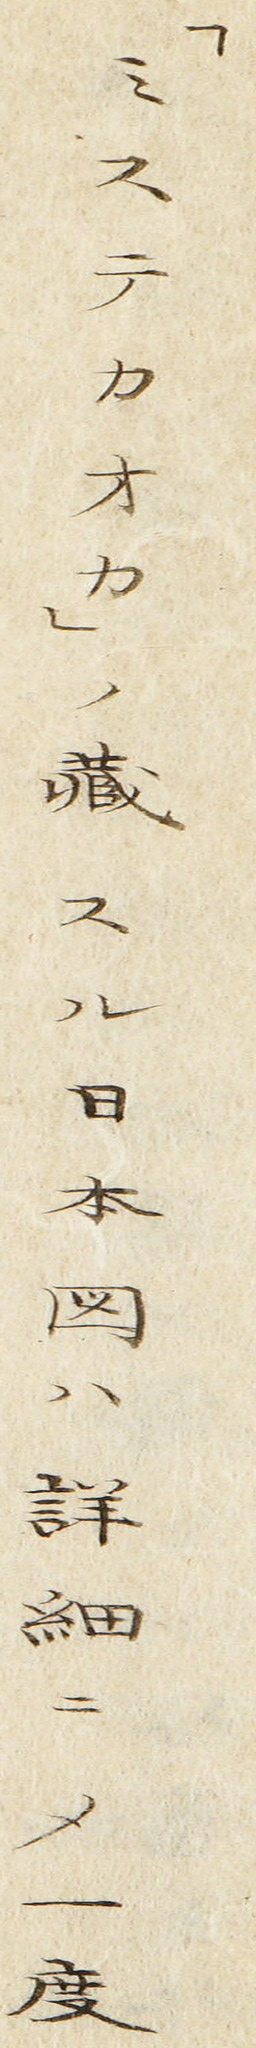〇「ミステカオカ」ノ蔵スル日本図ハ詳細ニシテ一度
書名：蕃談
